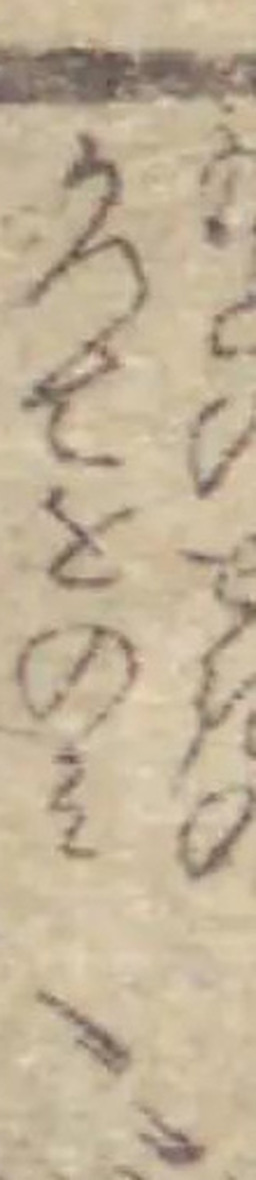かつてをのみ
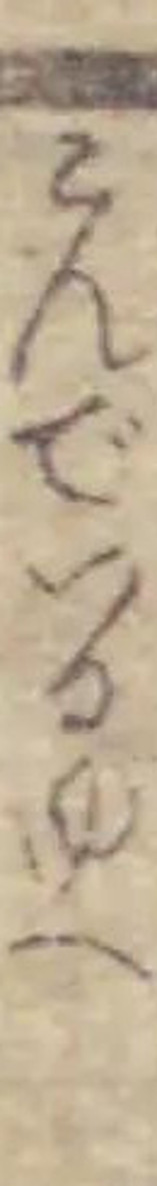こんでいるゆへ
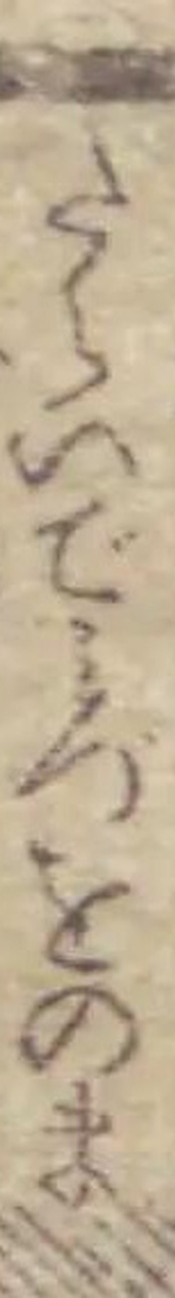たらいでみづをのま
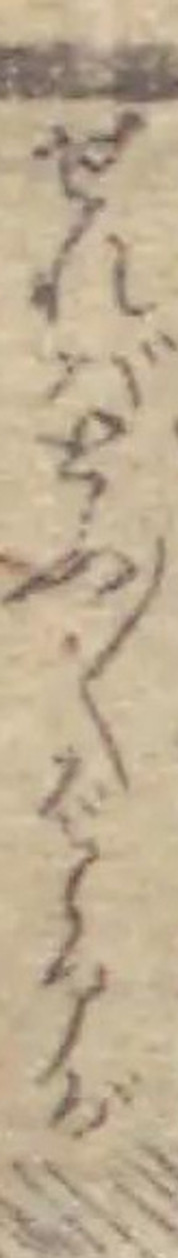せればとふ〳〵ばゞアが

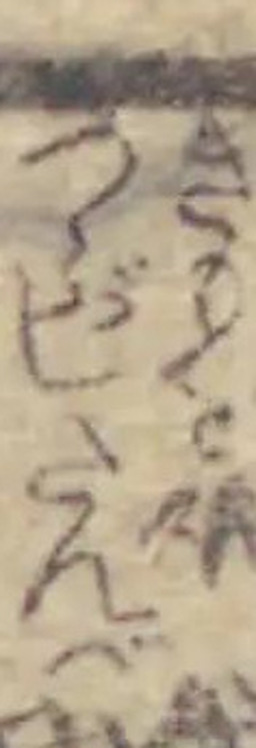つぶしたんば
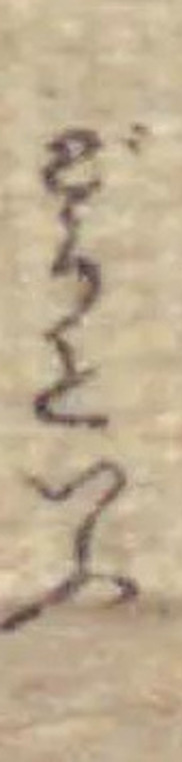どうといふ
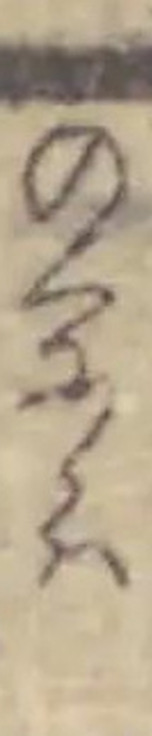のくにゝは
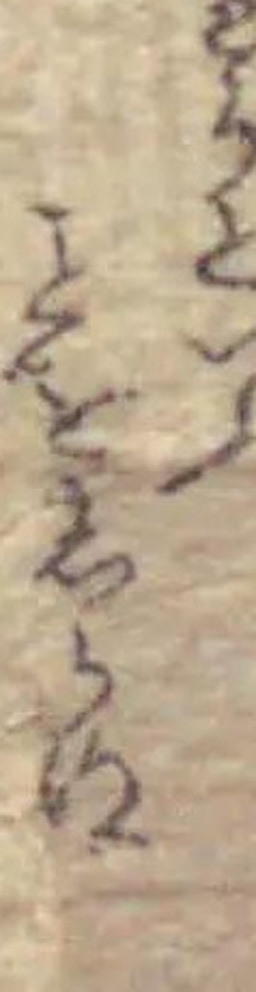ことをしらぬ
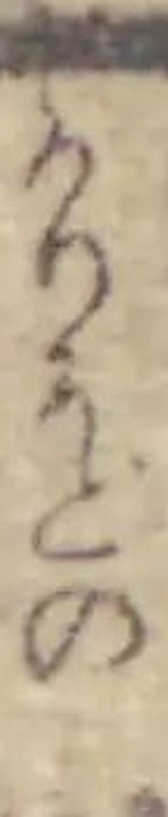かりうどの
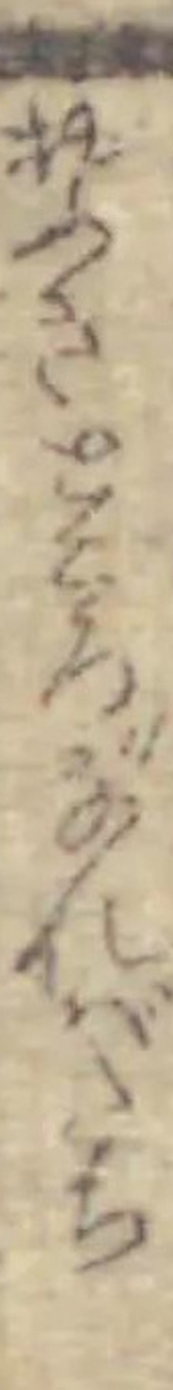おふきところなればたち
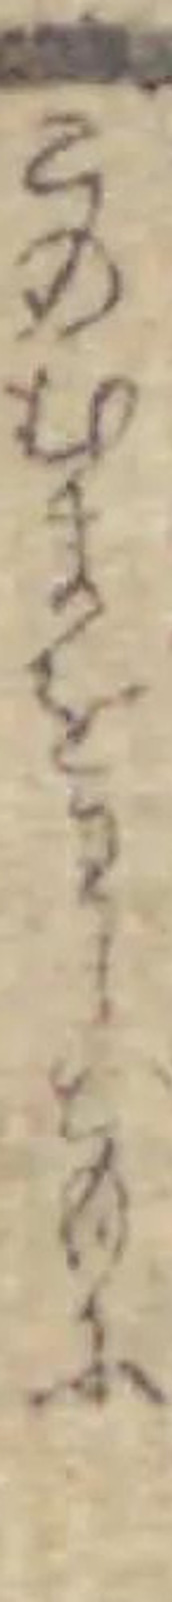このむまをわしどもに
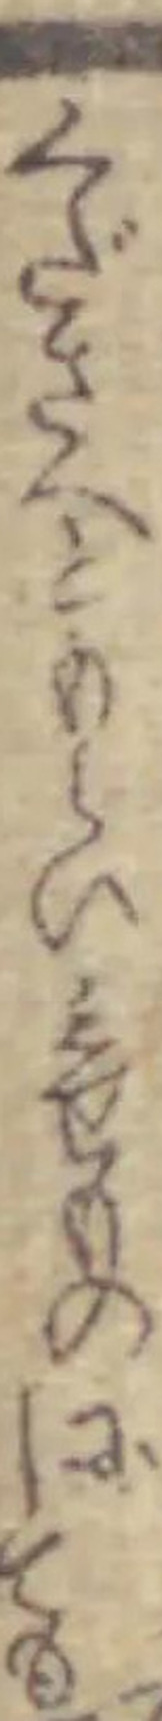くださへともらいみせものに
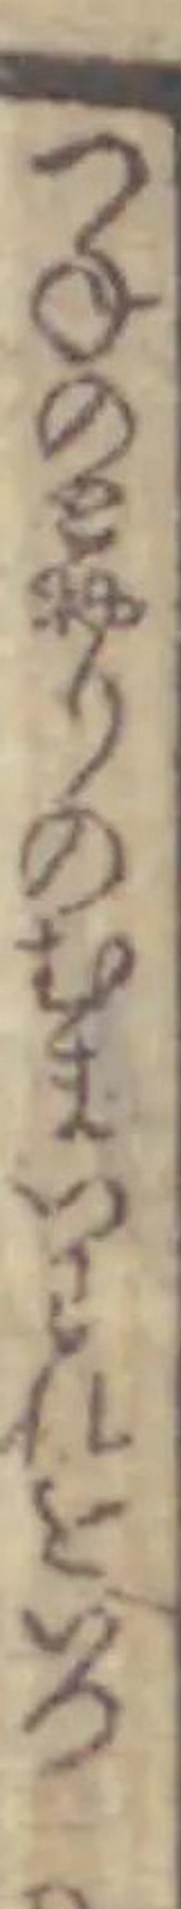つねのとおりのむまいわれをいつ
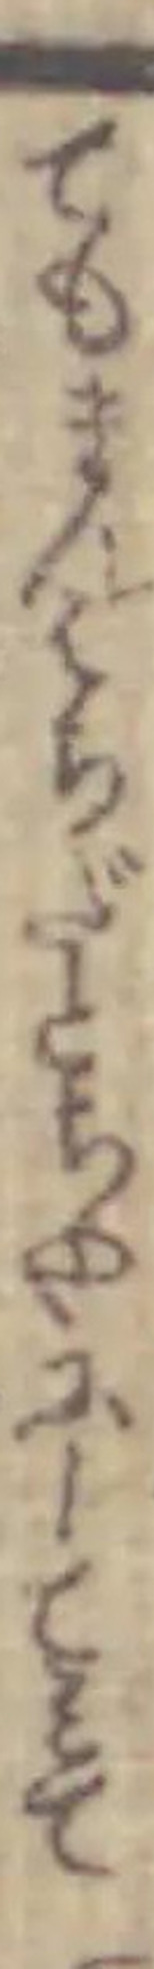てもまんはちだとちやにしてみて
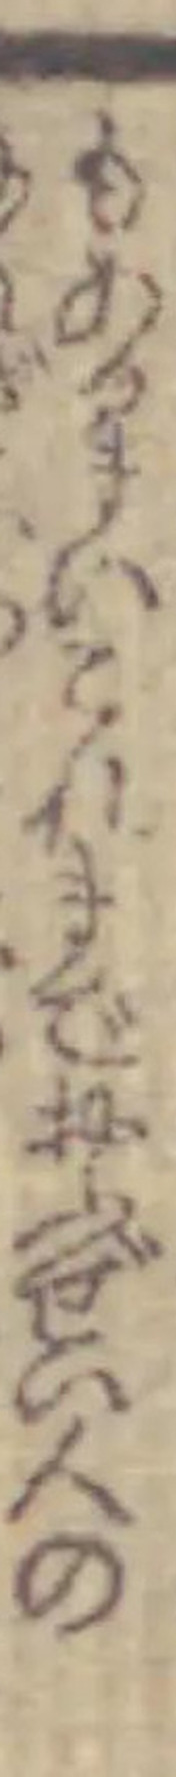もあるまいこれまでおふぜい人の
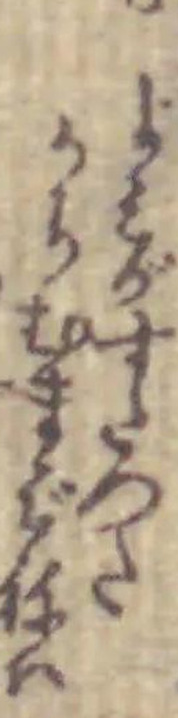よみがすたつた
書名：もふもふもふ怖噺 2巻
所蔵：国立国会図書館 National Diet Library, JAPAN
